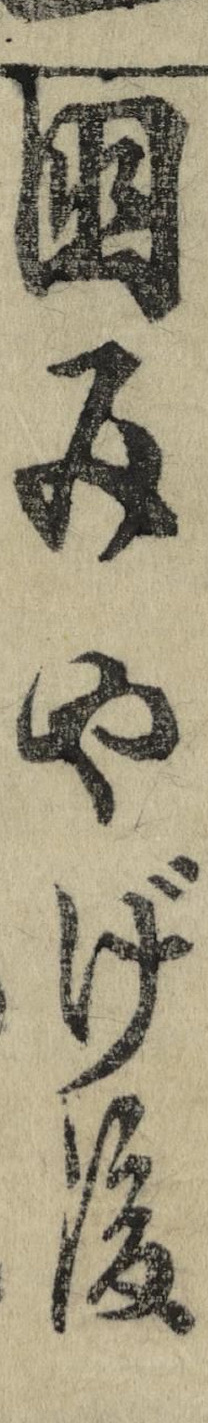国みやげ渡
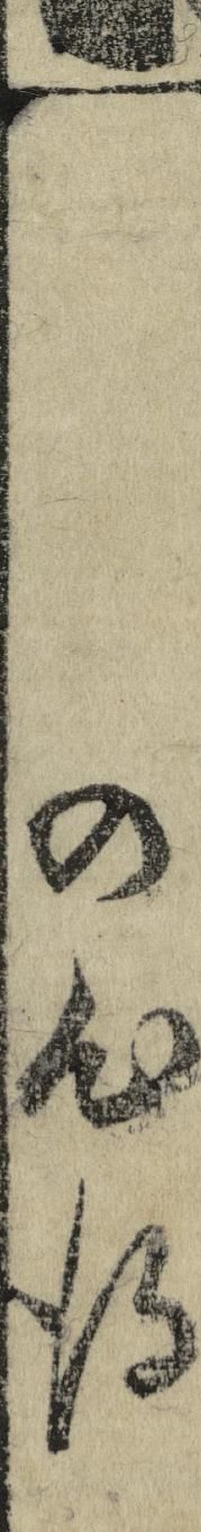の心得
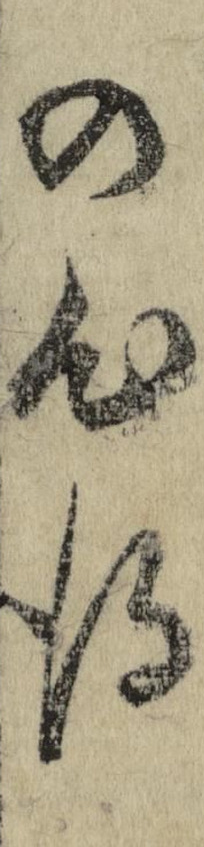の心得
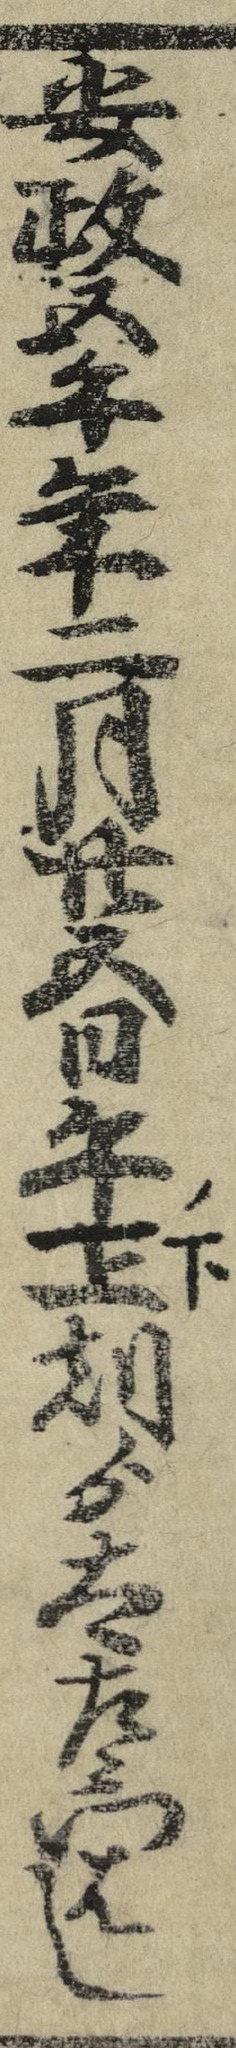安政五午年二月廿五日午一上刻ゟ太左衛門はし
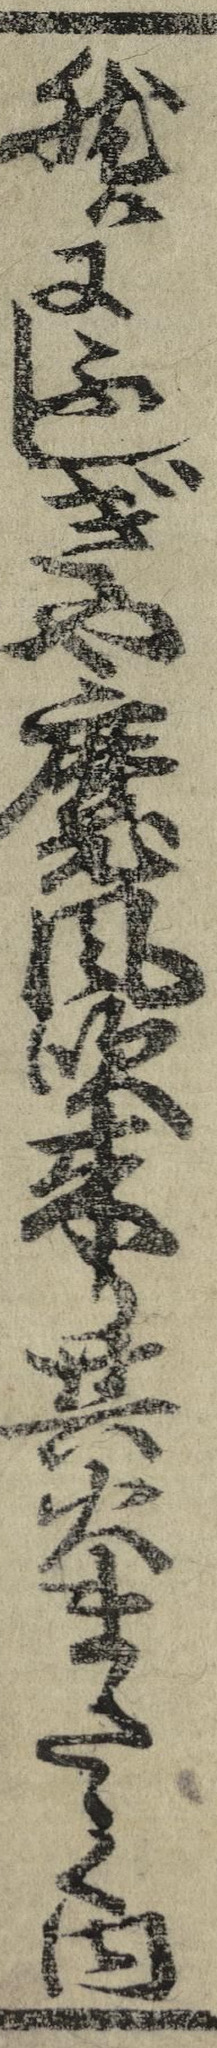然ルにふしぎや魔風吹来り其火またゝく内
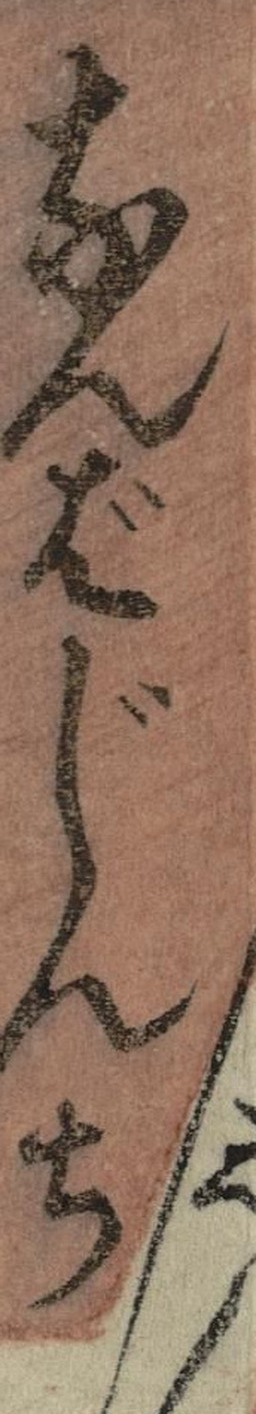なんばじんち
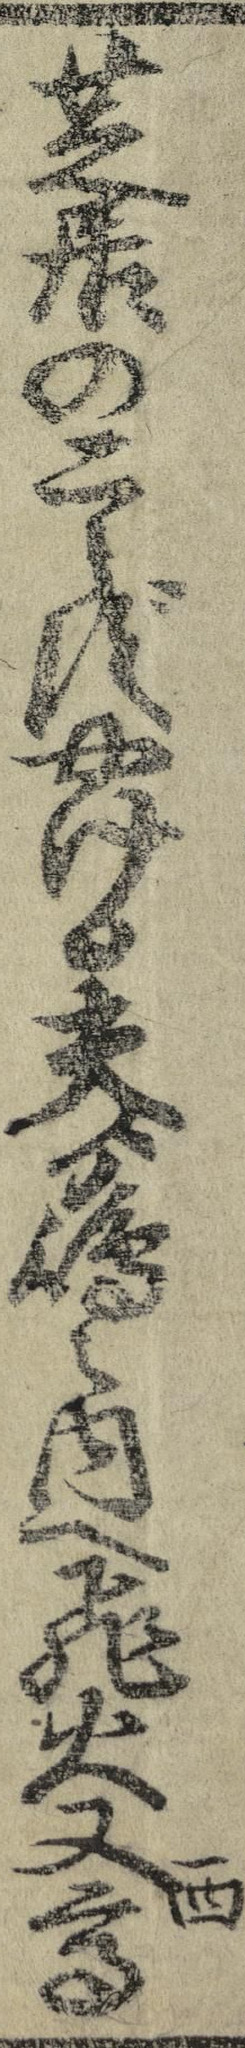芝居のこらずやける夫ゟ嶋之内へ飛火又西高
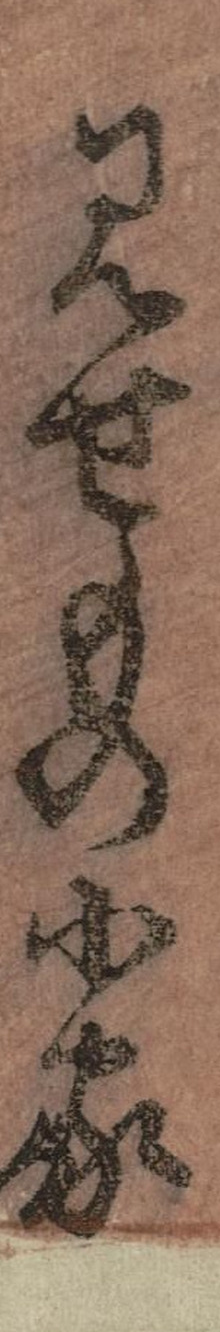見世もの小家
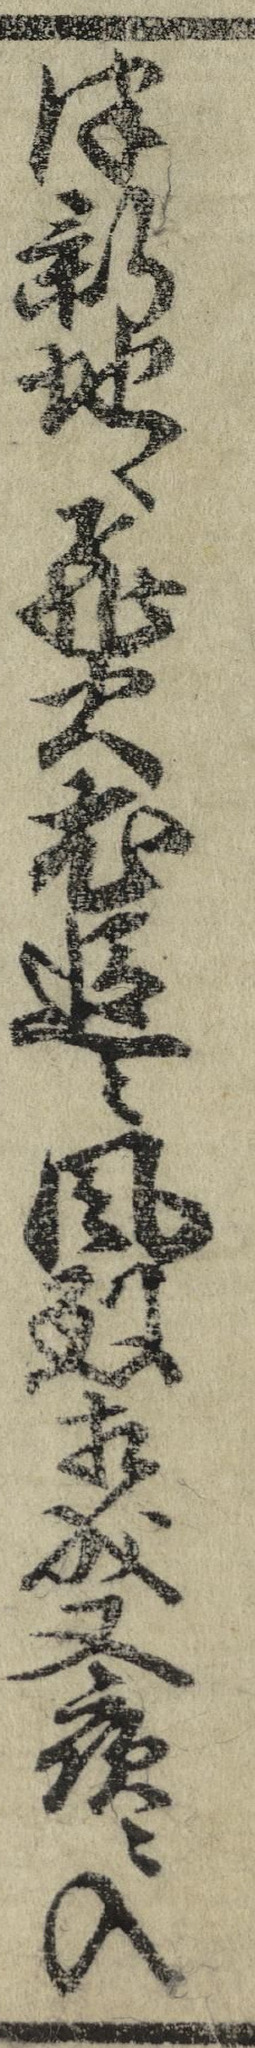津新地へ飛火尤追々風致相成又夜に入
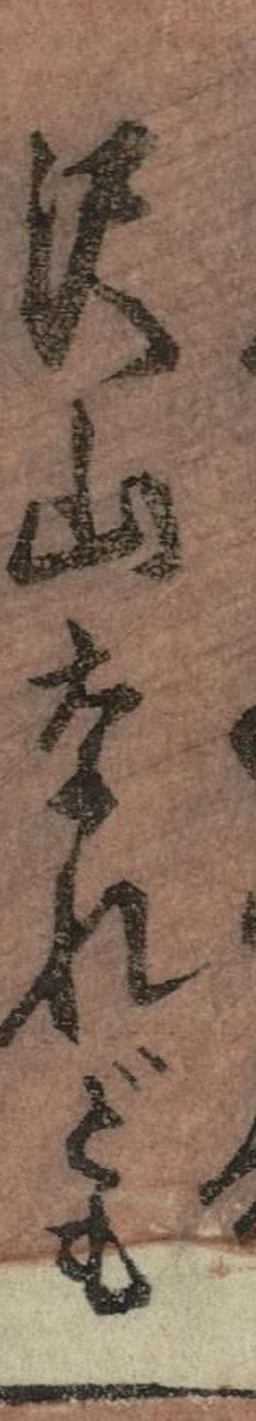沢山なれども
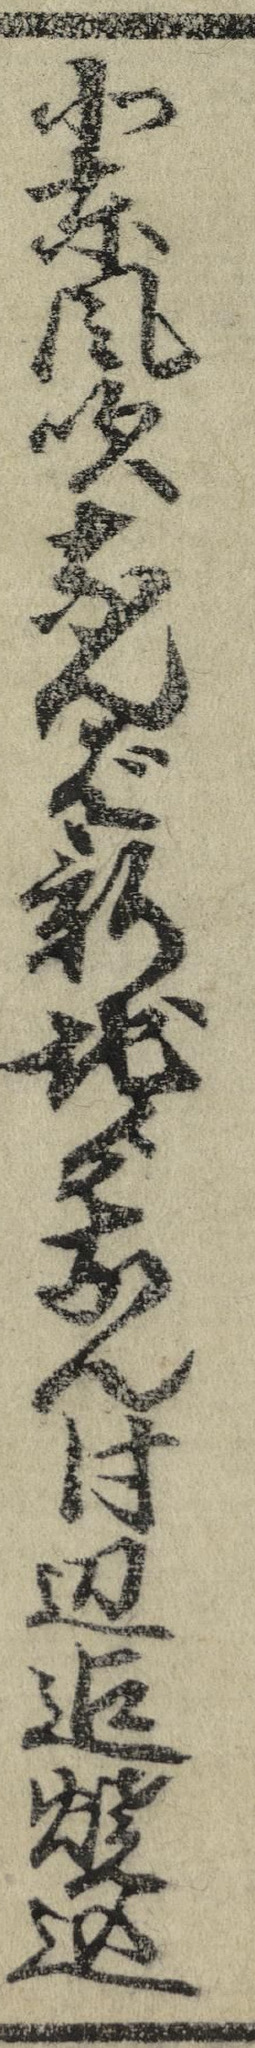北東風吹なんば新地ゟなんは辺迄焼込
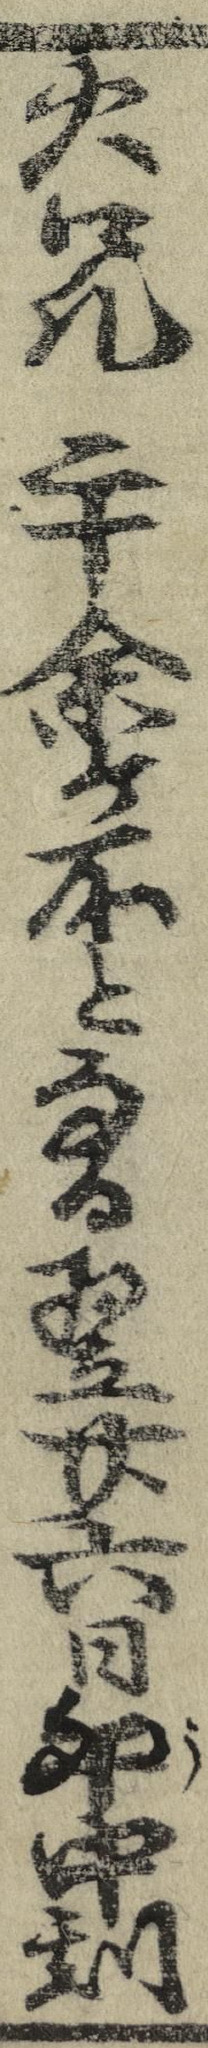火口凡二十余ケ所となる翌廿六日卯中刻
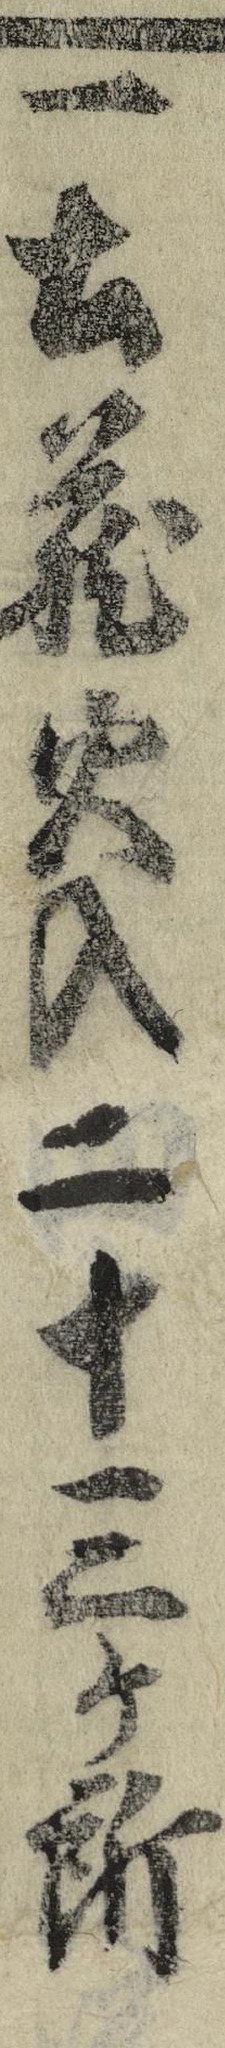一土蔵火入二十三ケ所
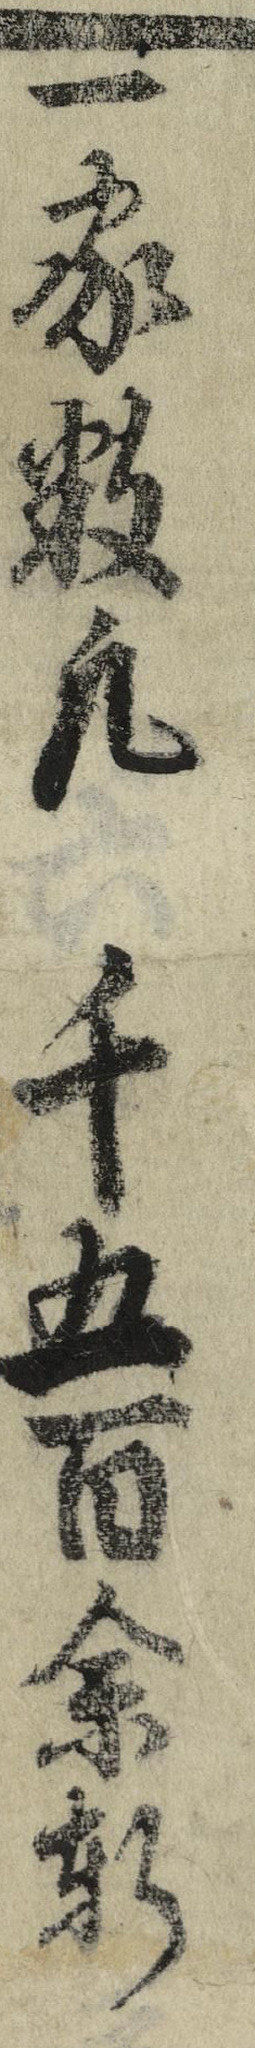一家数凡千五百余軒
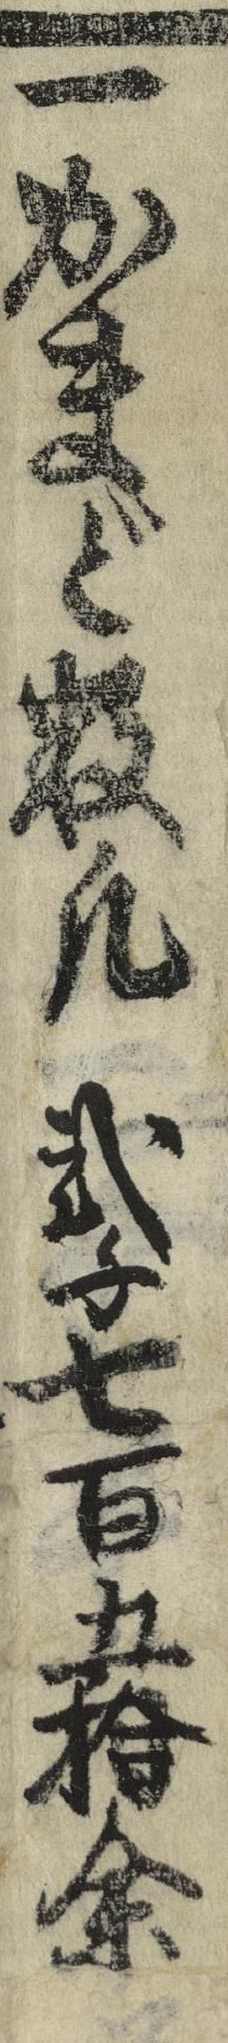一かまど数凡弐千七百五拾余
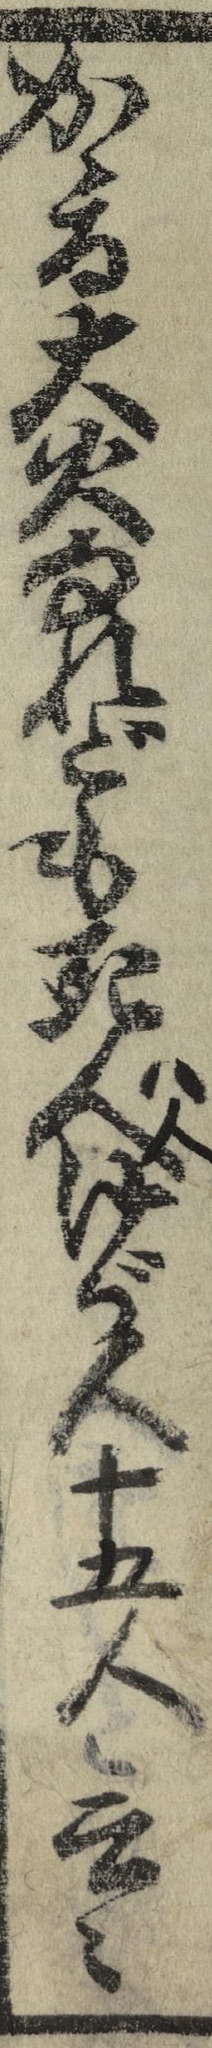かゝる大火なれども死人けが人十五人云々
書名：聞書　細見大阪大火図
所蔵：東京大学地震研究所図書室 Earthquake Research Institute Library, The University of Tokyo, JAPAN
